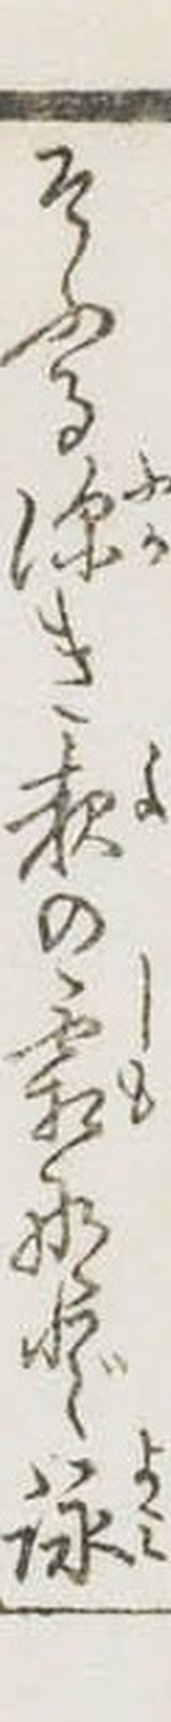そふる深き夜の霜など詠
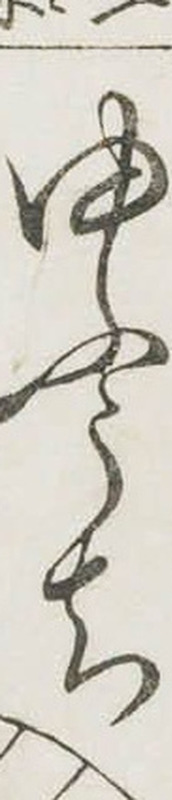ゆふうち
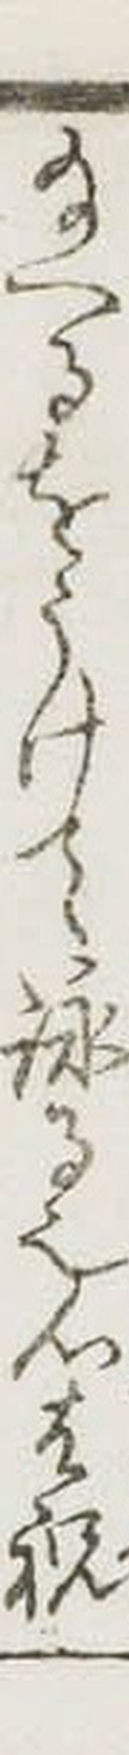給へるをうけて詠る也心は祝
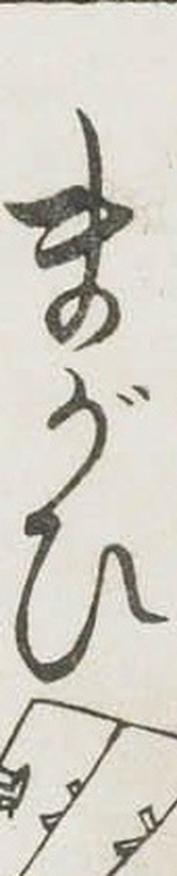まがひ
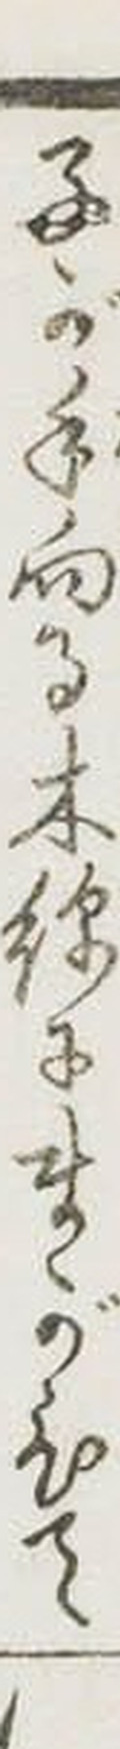子が手向る木綿にまがひて
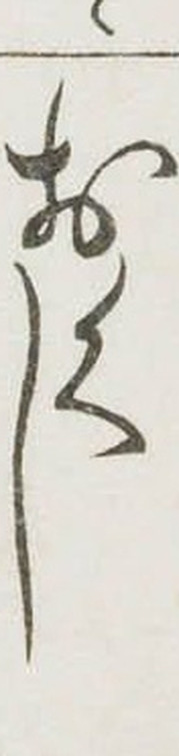おくし
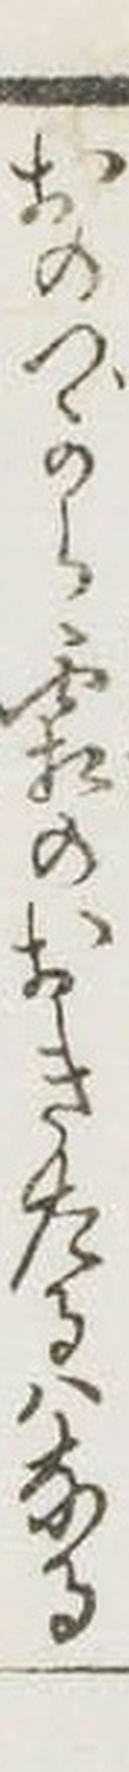おのづから霜のおきたるはなる
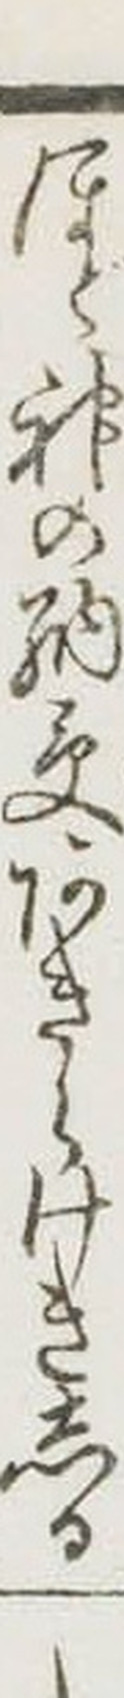ほど神の納受あきらけきしる
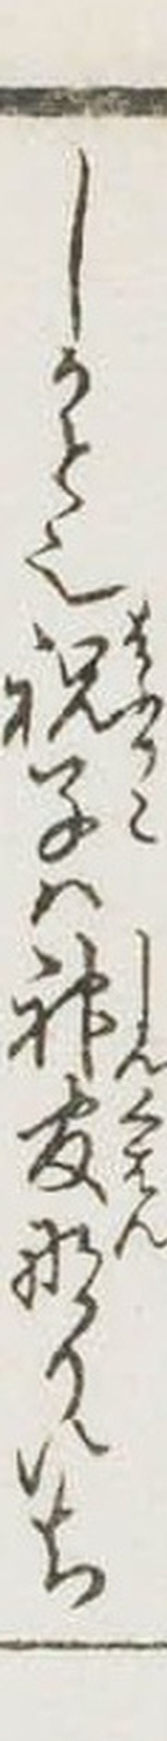しかと也祝子は神官なりいち
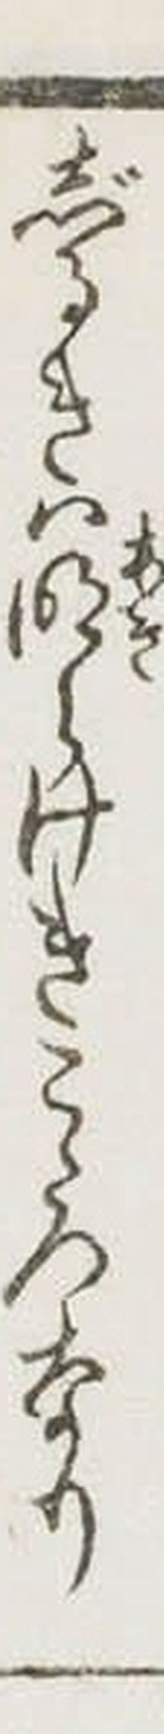じるきは明らけきこゝろなり
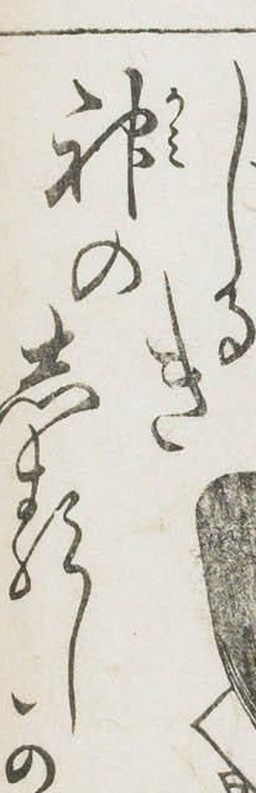神のしるしか
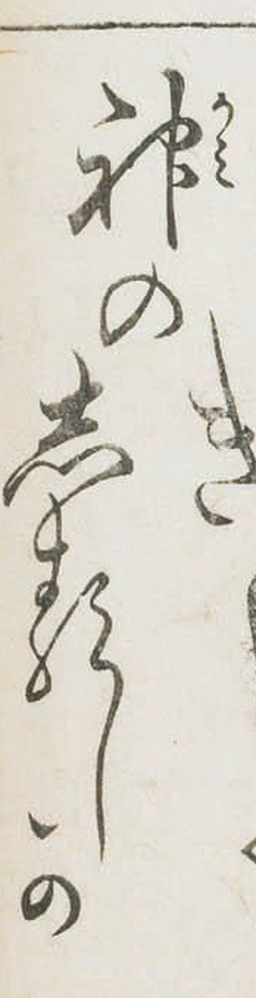神のしるしか
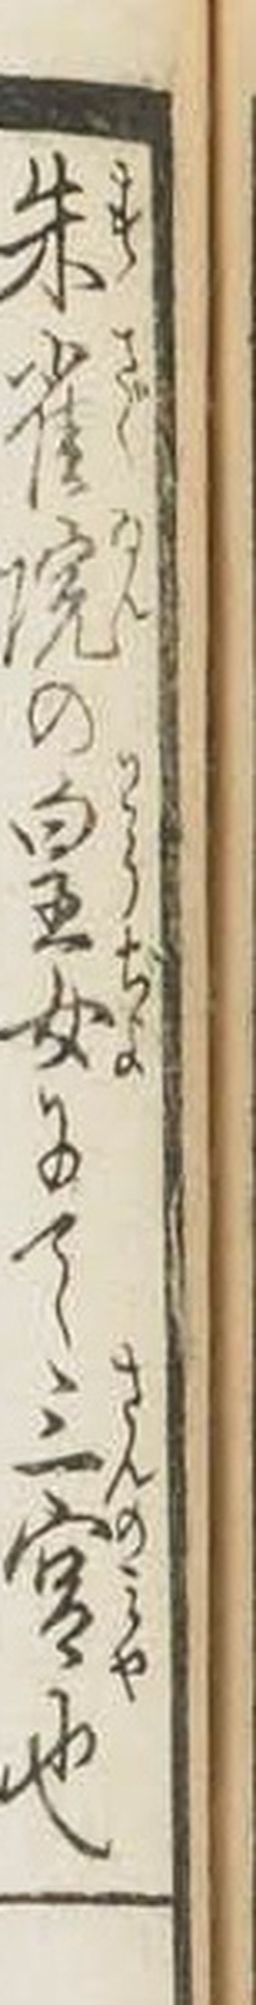朱雀院の皇女にて三宮也
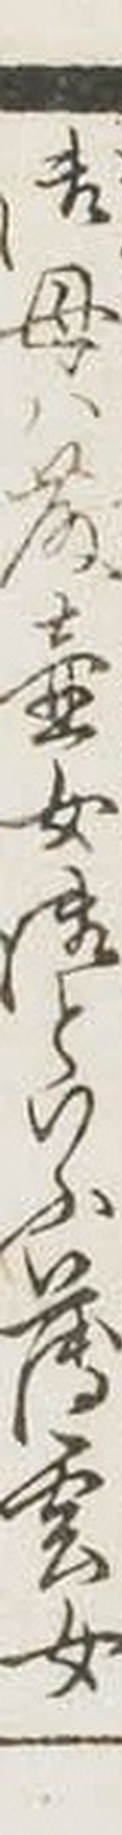御母は藤壺女御といふ薄雲女
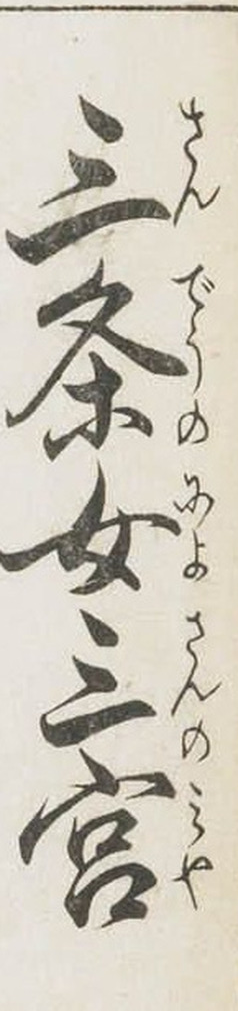三条女三宮
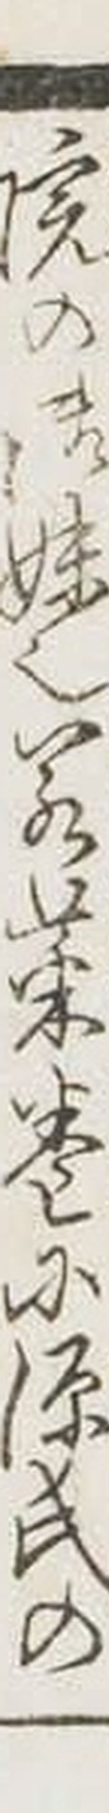院の御妹也若菜巻に源氏の
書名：源氏百人一首
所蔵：東京学芸大学教育コンテンツアーカイブ
